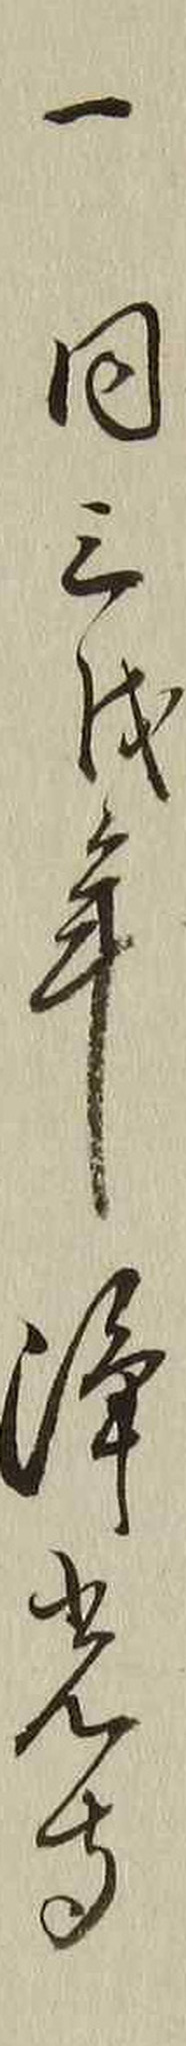一同三戌年浄光寺
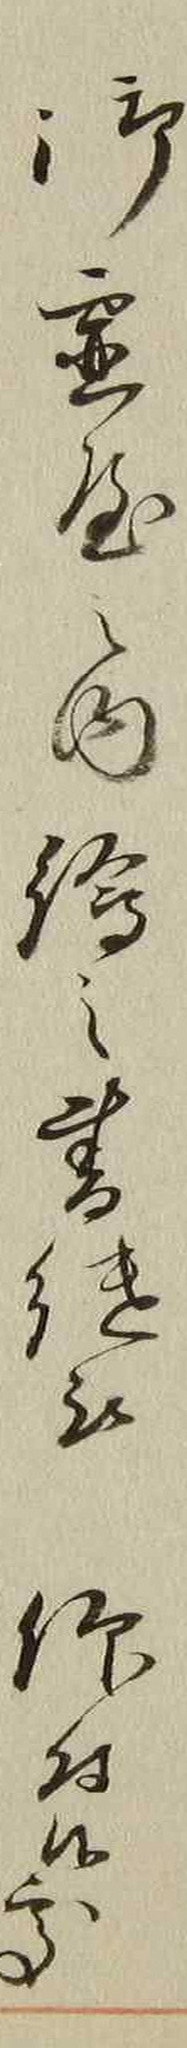御霊屋之内絵之書継被仰付候処
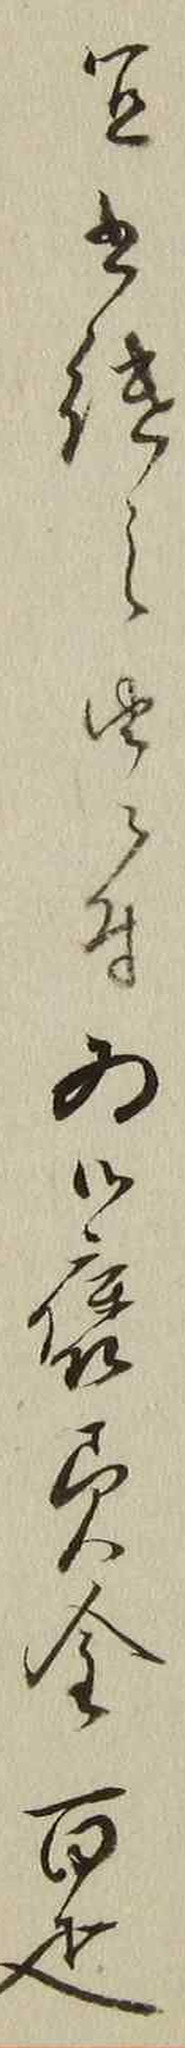宜書継之由ニ付為御褒美金百疋
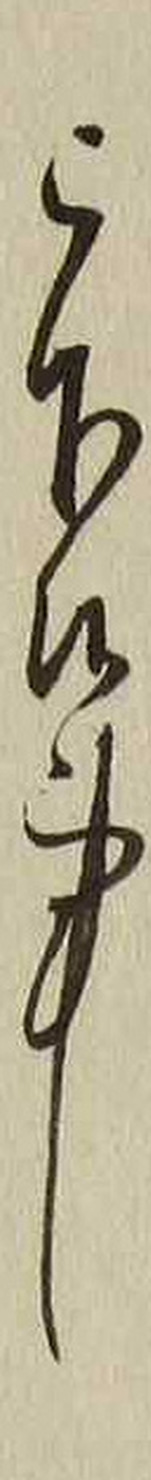被下候事
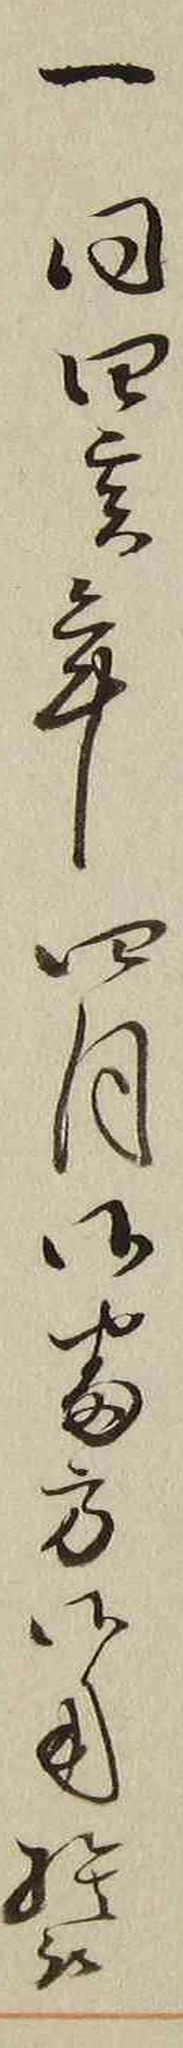一同四亥年四月御番方御用捨被
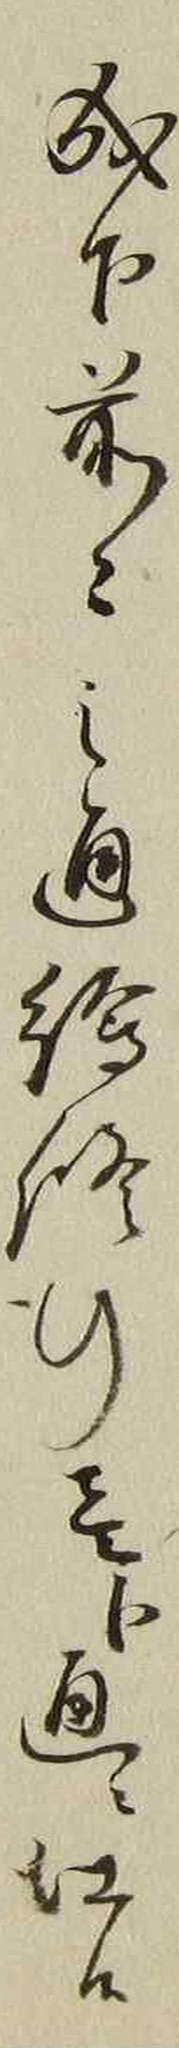成下前々之通絵修行壱卜通に仕候
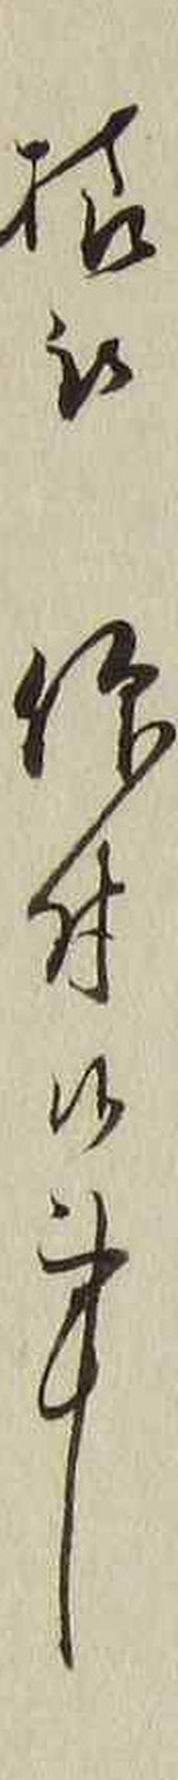様被仰付候事
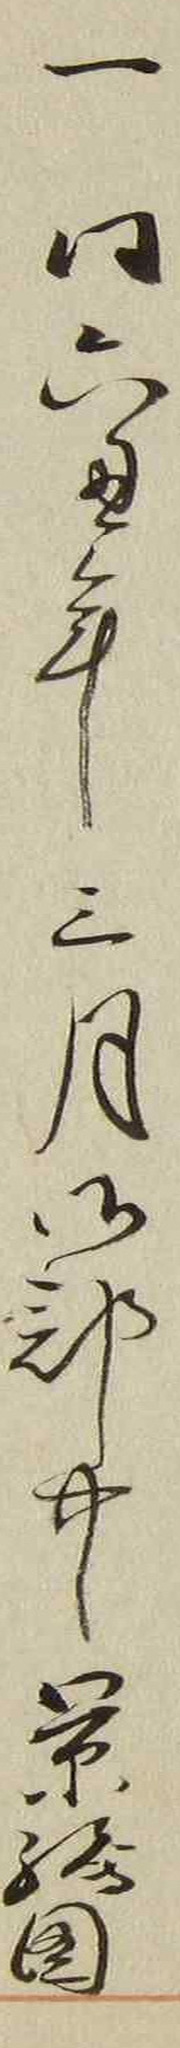一同六丑年三月御部中景絵図
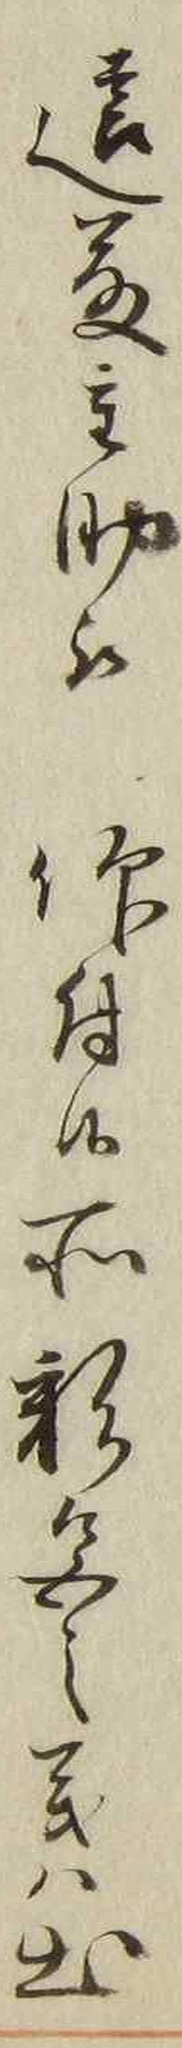遠藤重助被仰付候所彩色之義ハ出
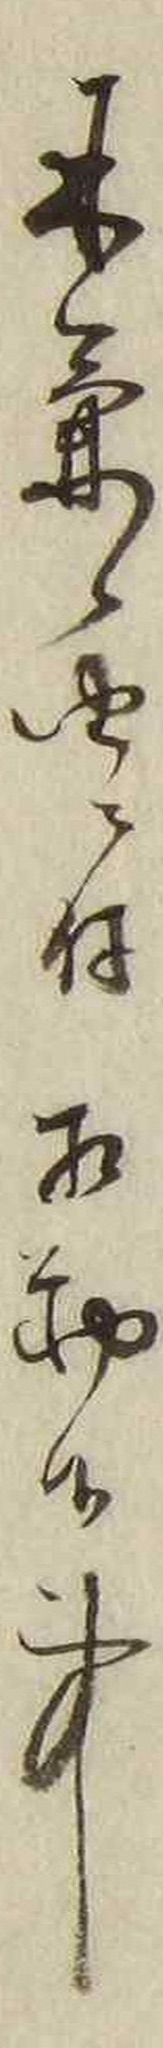来兼候由ニ付相勤候事

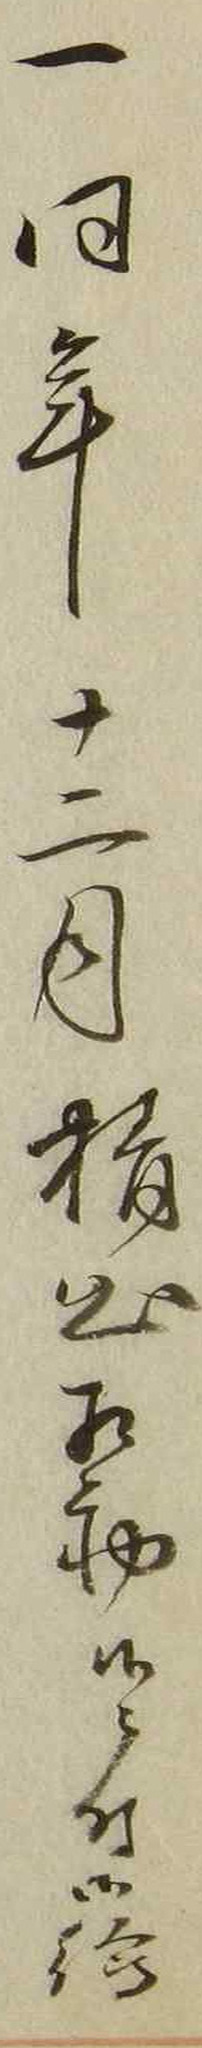一同年十二月精出相勤候ニ付御絵
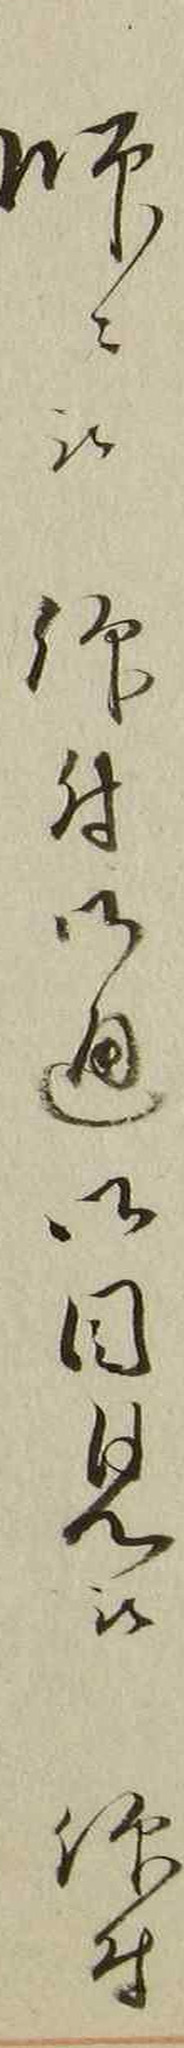師ニ被仰付御通御目見被仰付
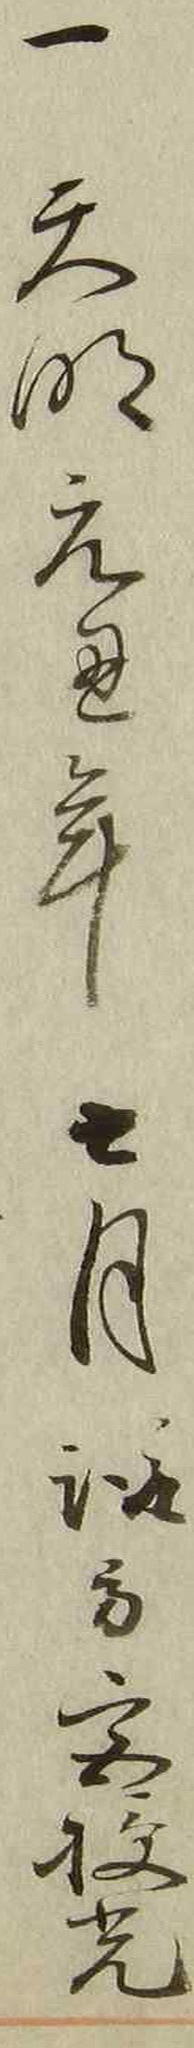一天明元丑年七月諏方宮授光
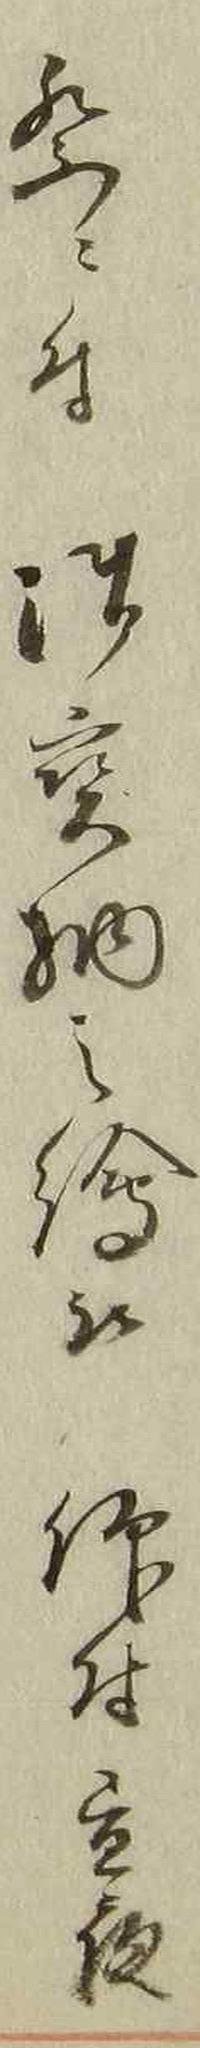祭ニ付御宝納之絵被仰付昼夜
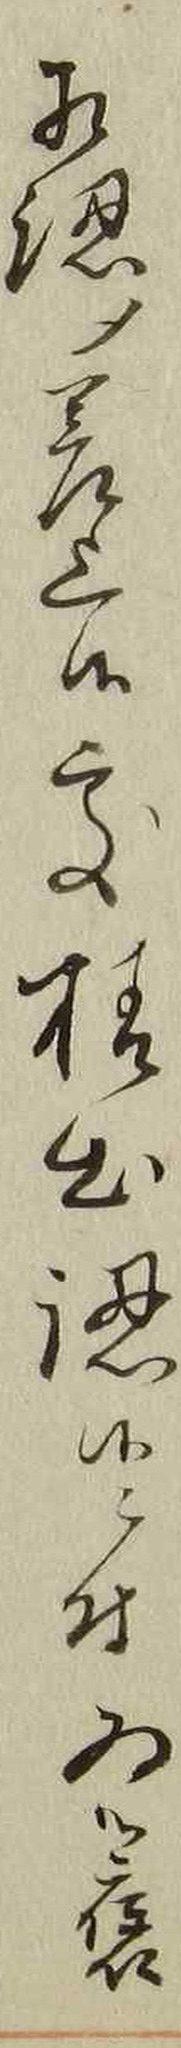相認メ差上候処精出認候ニ付為御褒
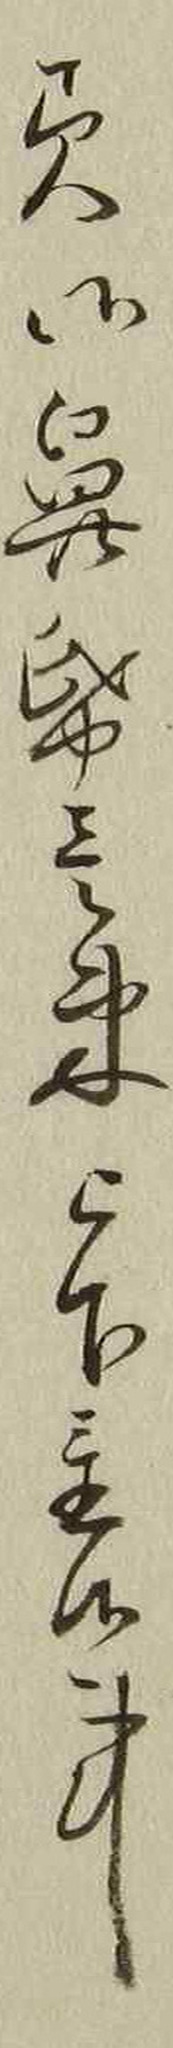美御鼻紙壱束被下置候事
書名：諸士系譜　巻之132　た之部8
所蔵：会津若松市立会津図書館
